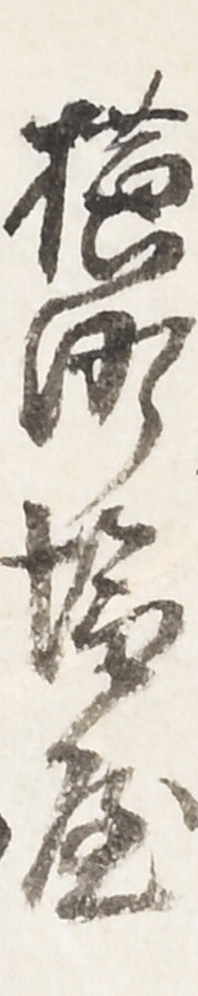横町塩屋
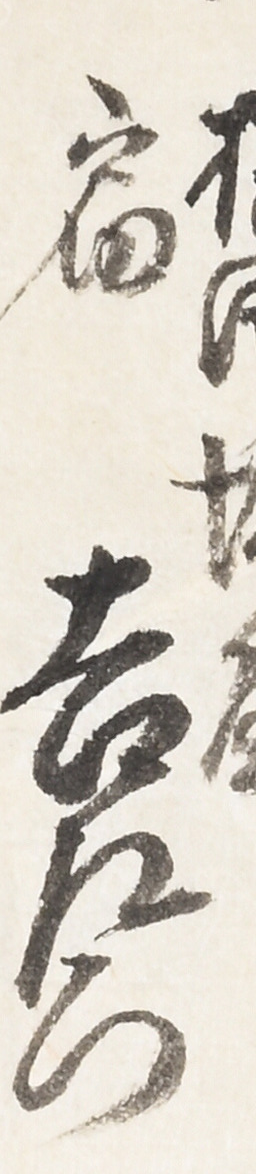宿吉左衛門
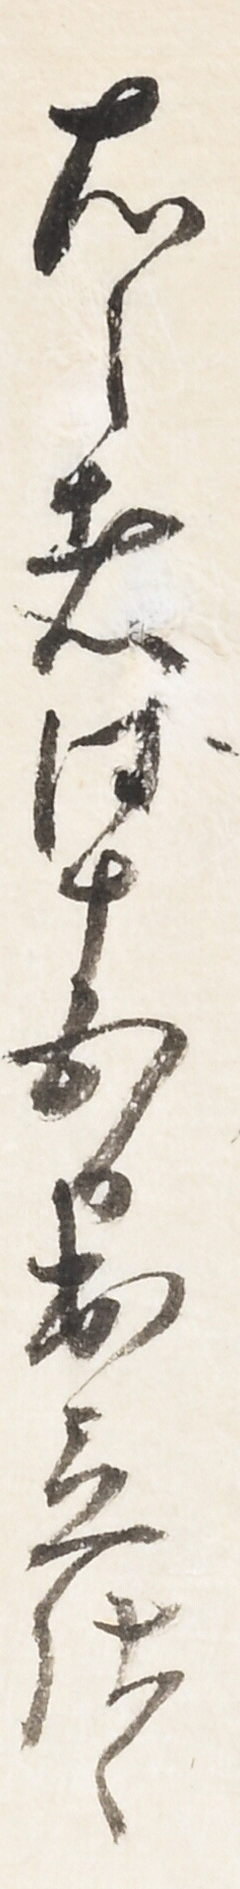右之者同十五日出立仕候
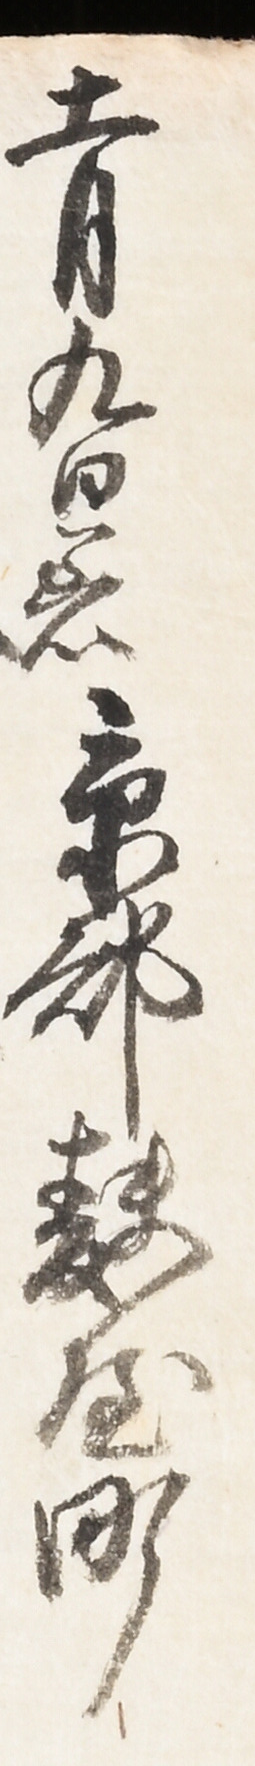十一月九日着京都麩屋町
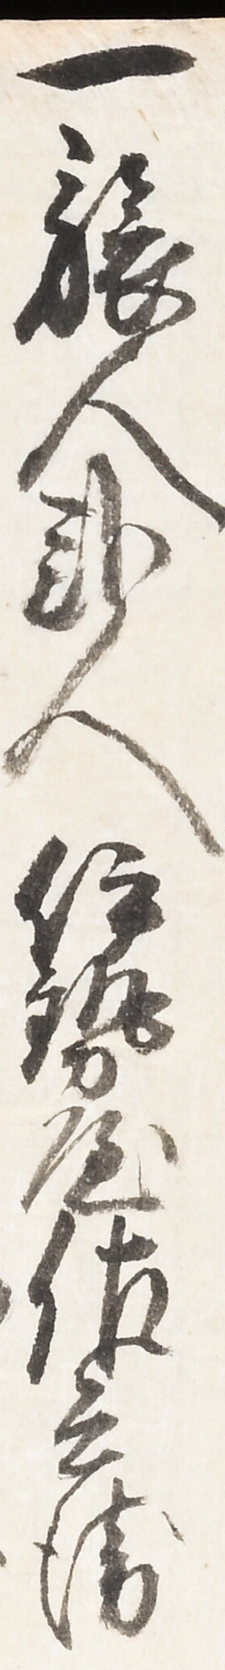一旅人弐人伊勢屋佐兵衛
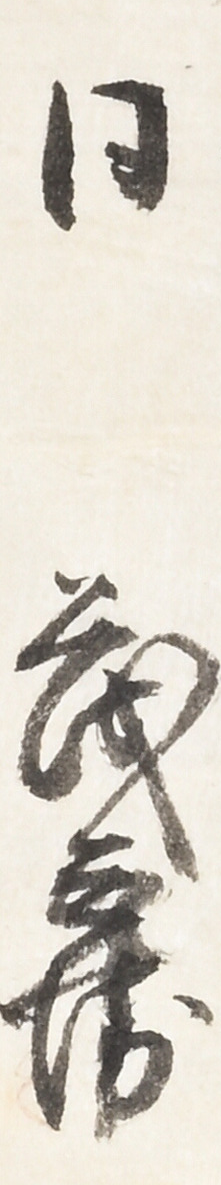同茂兵衛
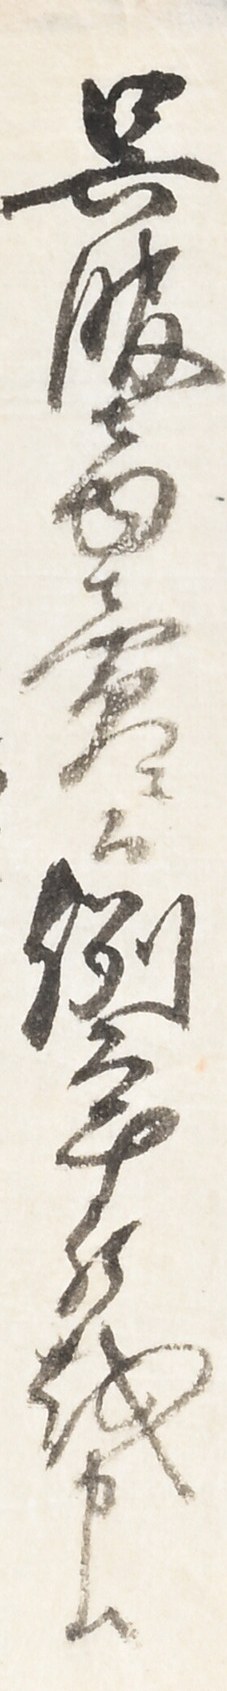呉服商売ニ而例年罷越申候
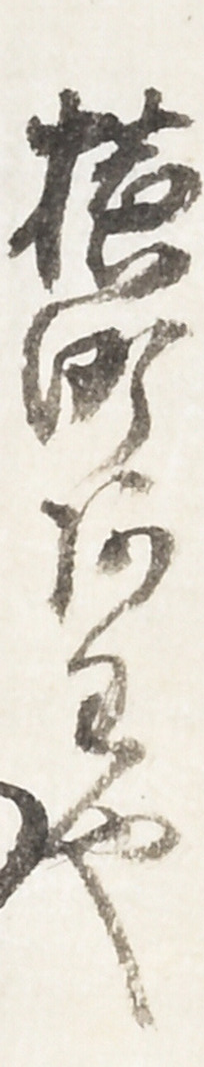横町あわや
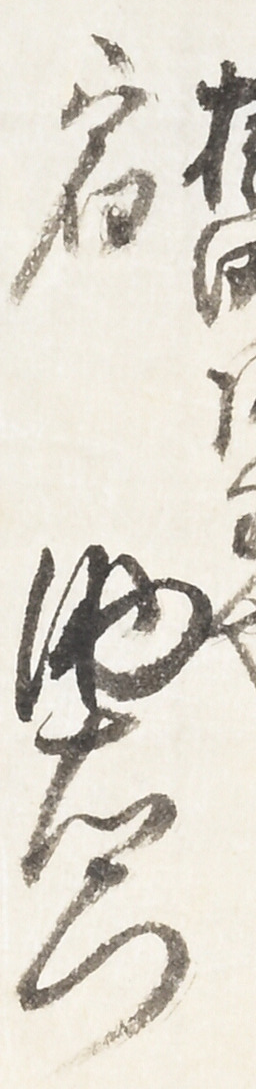宿助右衛門
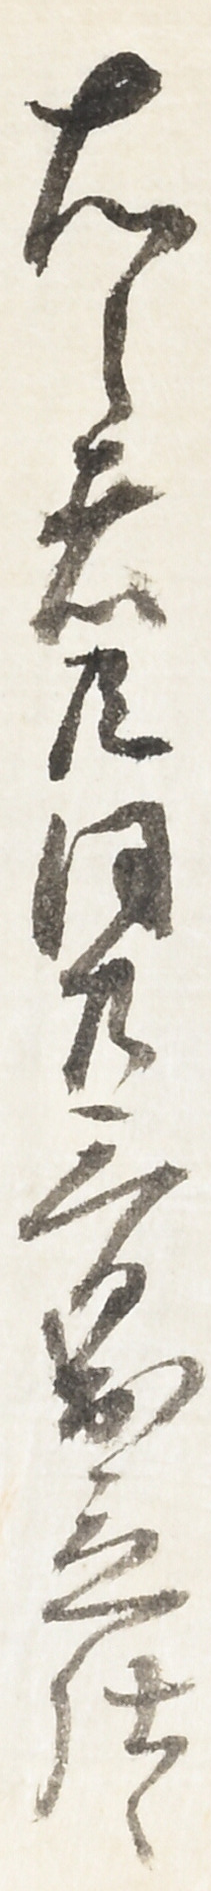右之者共同廿三日出立仕候
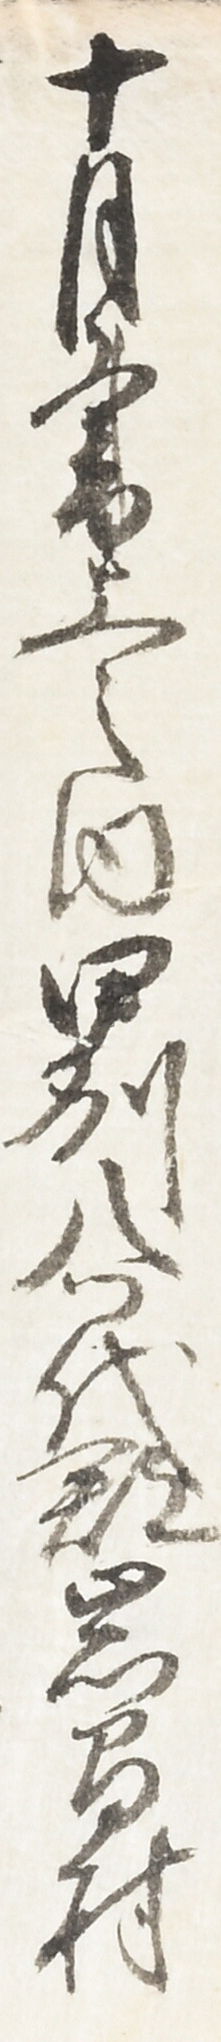十月書上之内甲州八ツ代郡岩間村
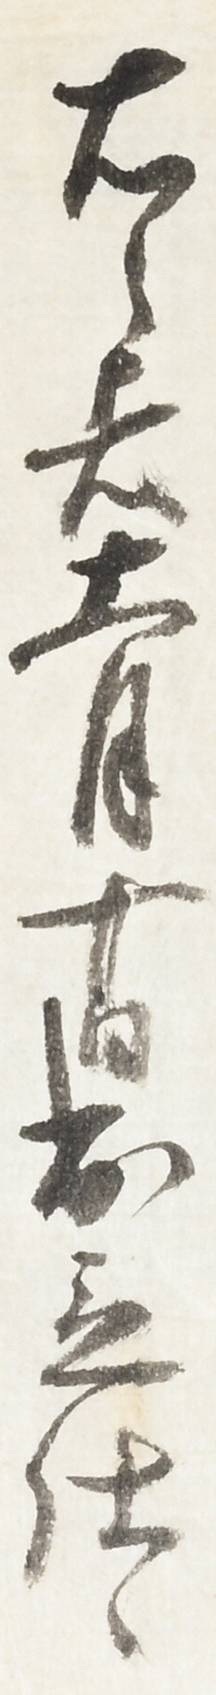右之者十一月十日出立仕候

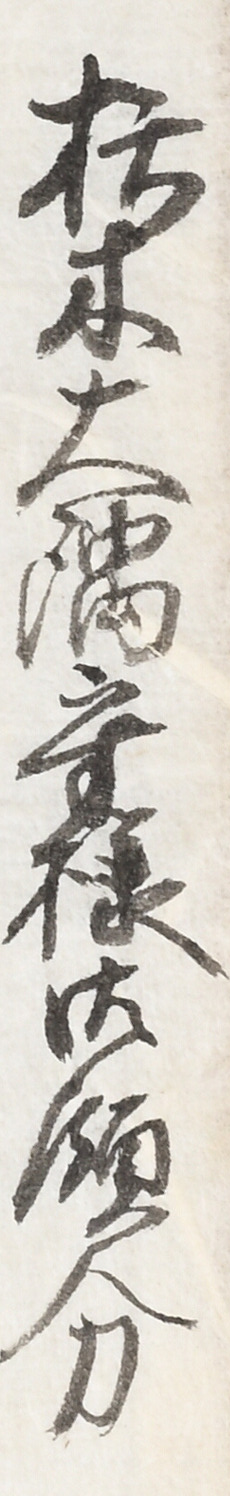朽木大隅守様御領分
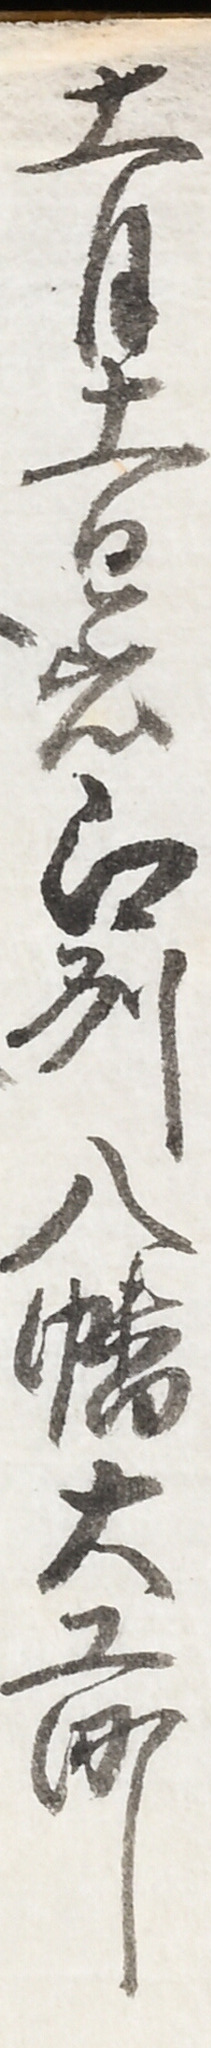十一月十一日着江州八幡大工町
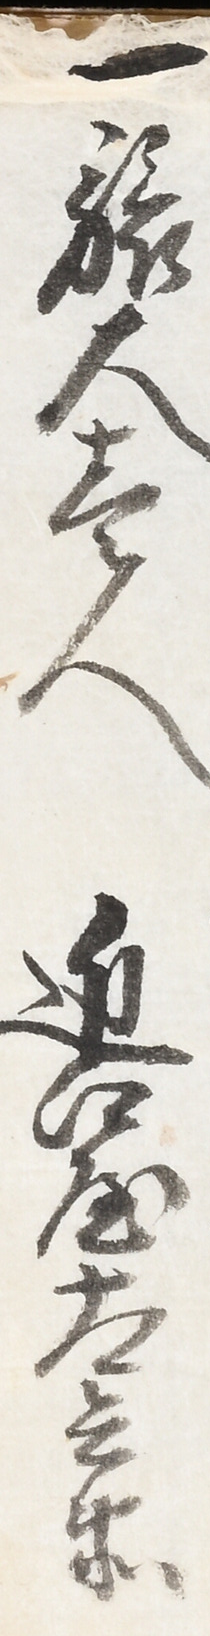一旅人壱人近江屋太兵衛
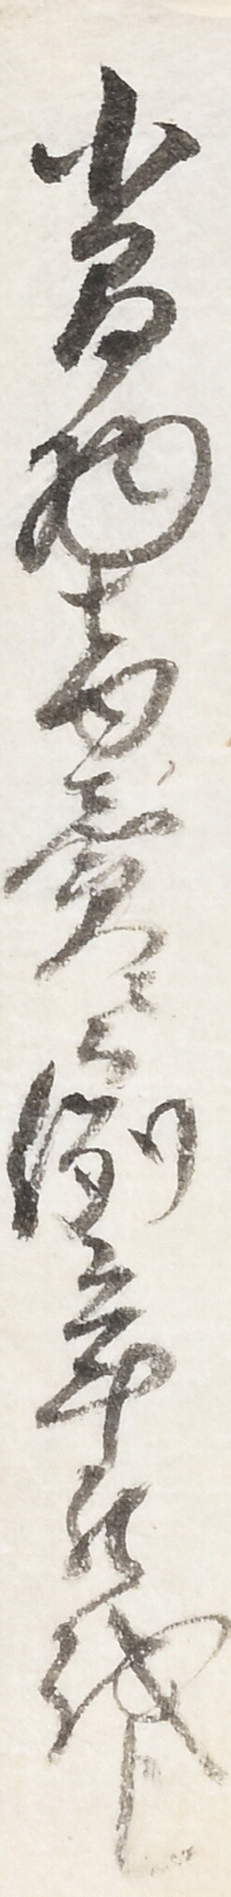小間物商売ニ而例年罷越申候
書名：旅人泊控帳
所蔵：伊那市立高遠町図書館・合同会社AMANE
